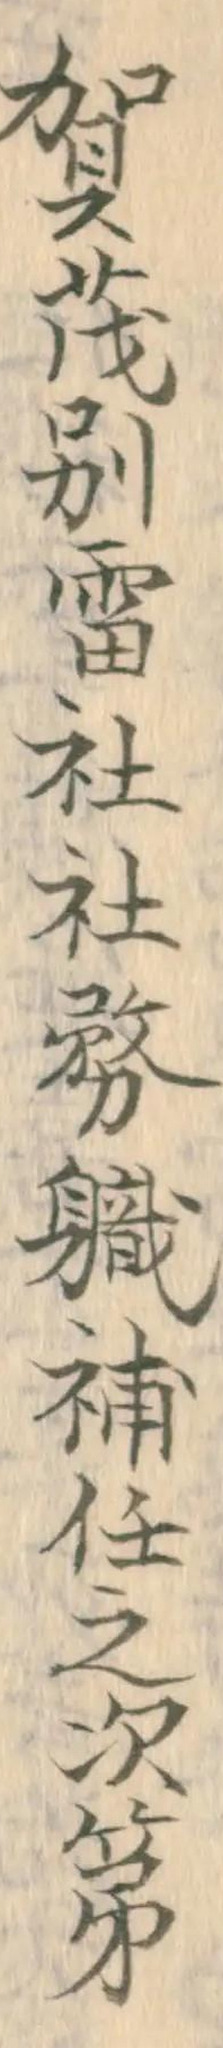賀茂別雷社社務職補任之次第
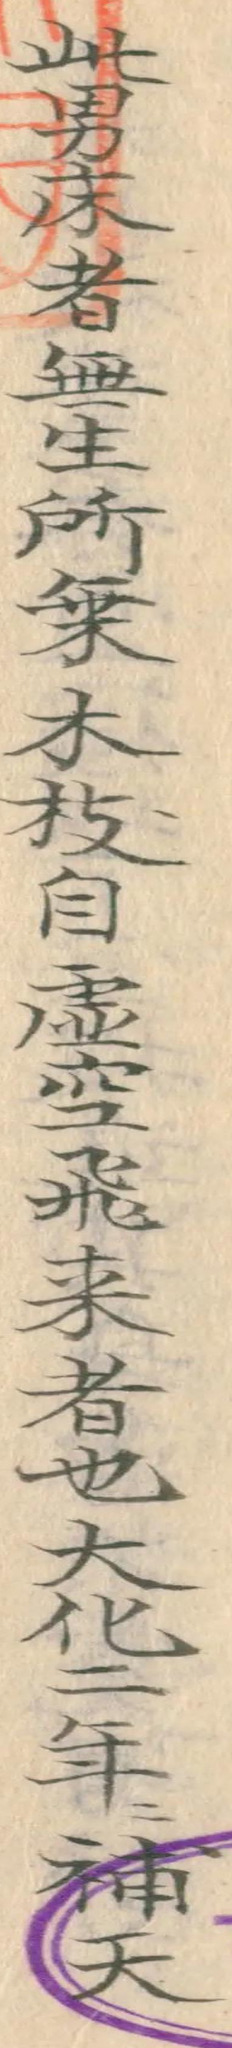男床此男床者無生所乗木枝自虚空飛来者也大化二年ニ補天
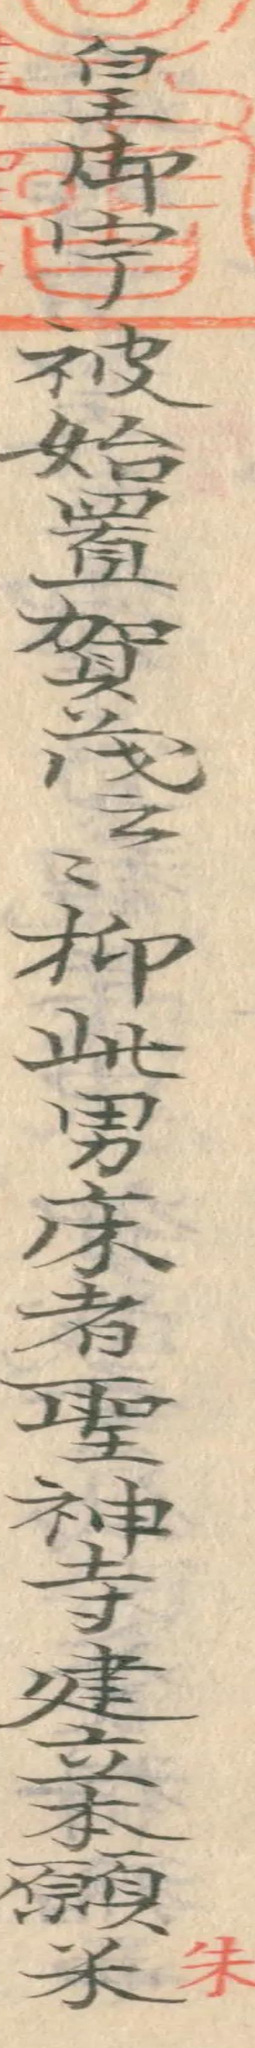皇御宇被始置賀茂云々抑此男床者聖神寺建立本願米
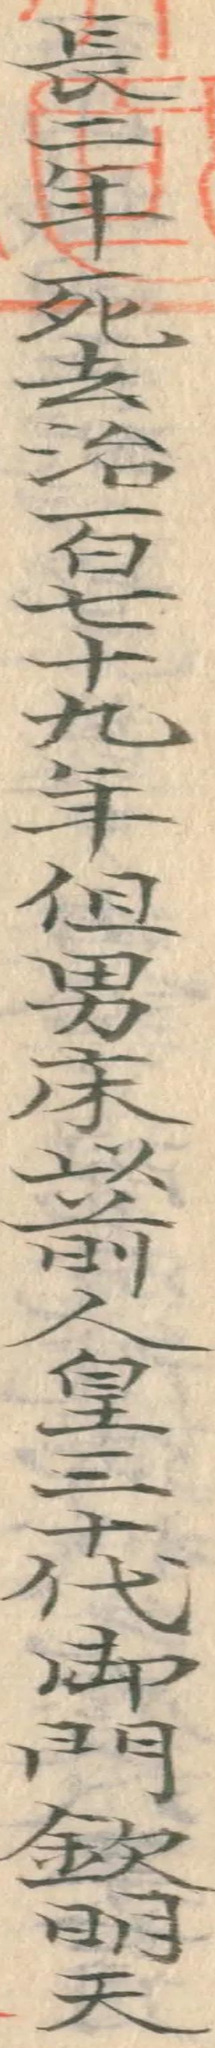長二年死去治百七十九年但男床以前人皇三十代御門欽明天
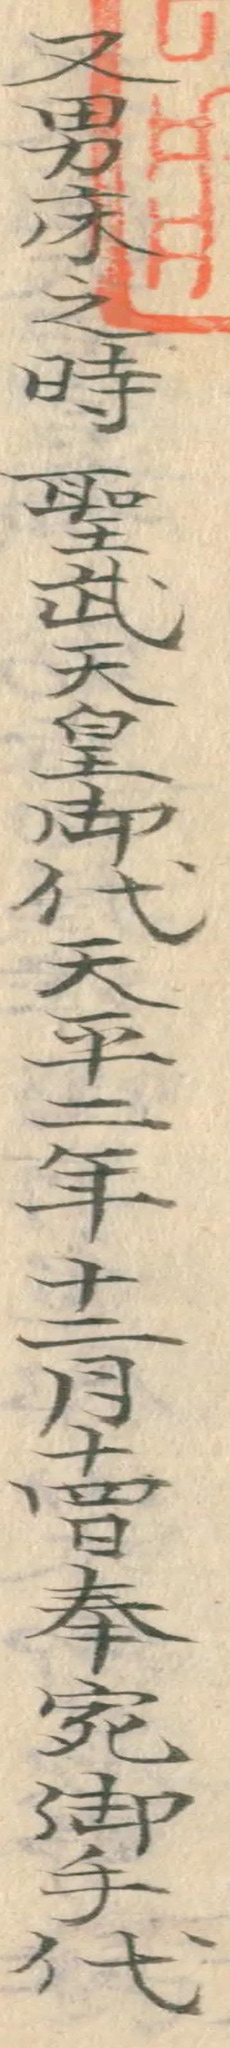又男床之時聖武天皇御代天平二年十二月十四日奉宛御手代
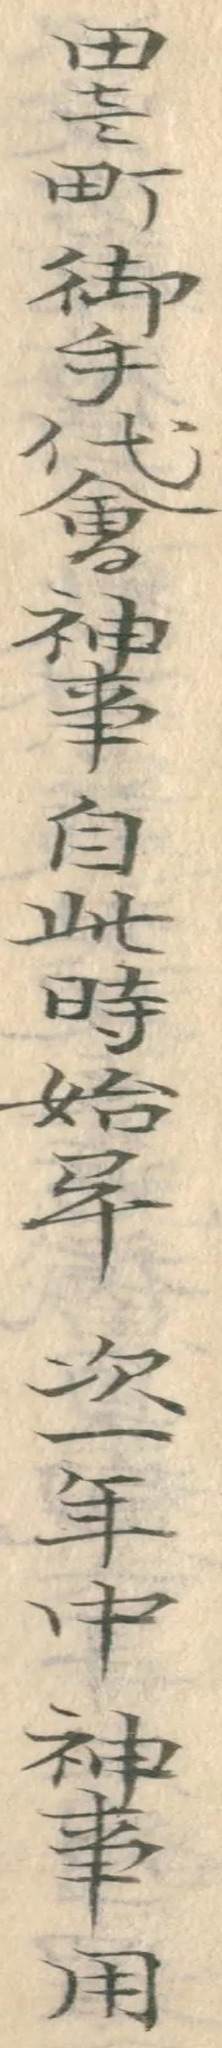田壱町御手代会神事自此時始畢次一年中神事用
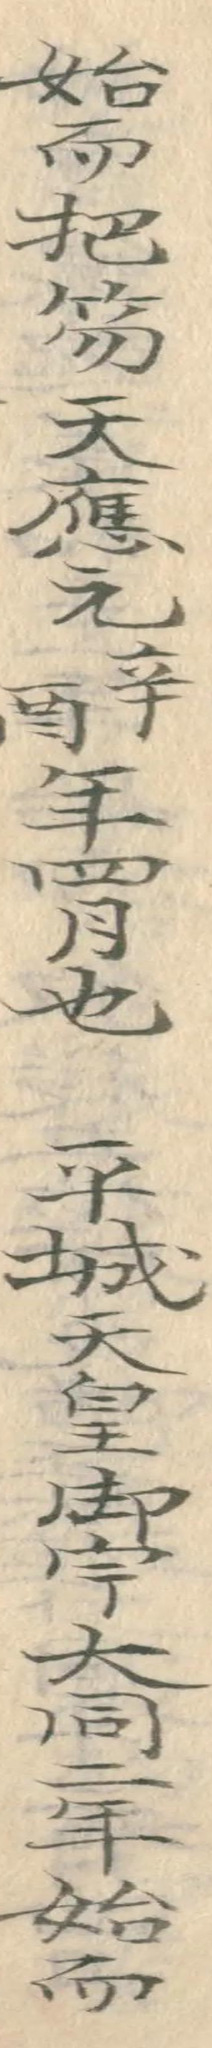始而把笏天応元辛酉年四月也平城天皇御宇大同二年始而
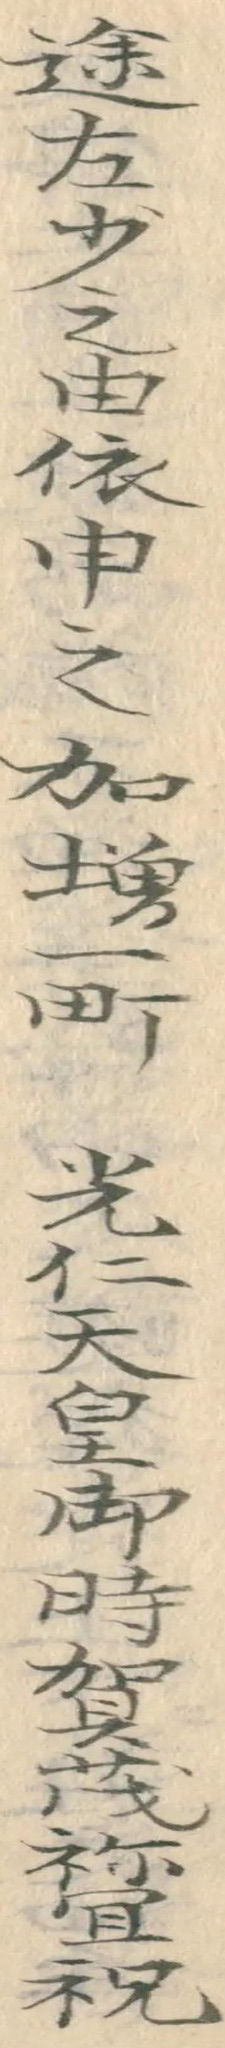途左少之由依申之加増一町光仁天皇御時賀茂祢宜祝
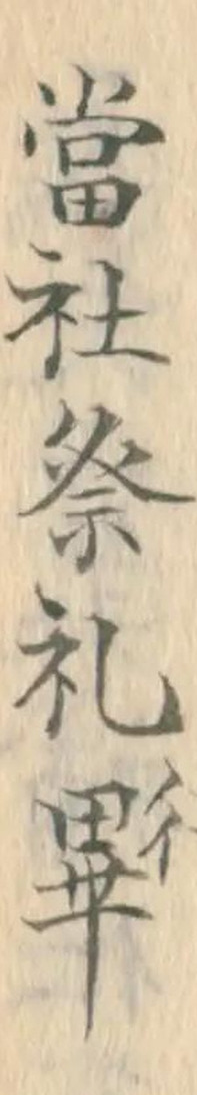当社祭礼畢

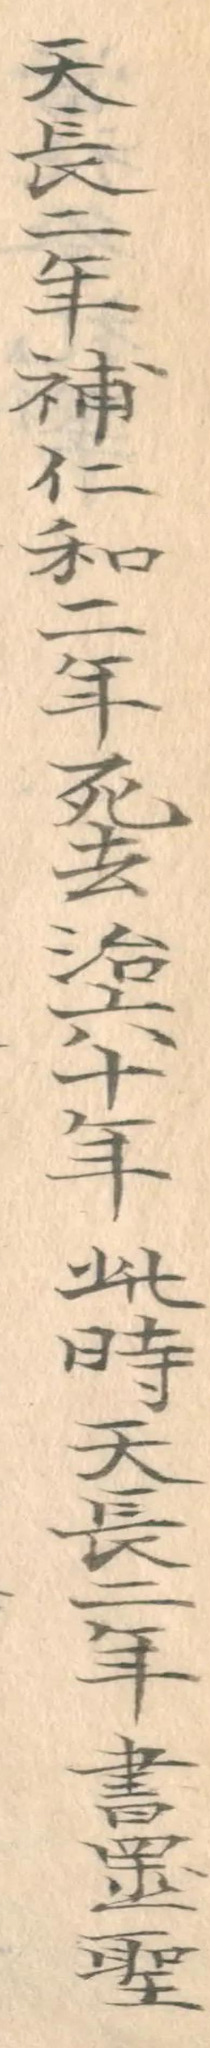廣友天長二年補仁和二年死去治六十年此時天長二年書置聖
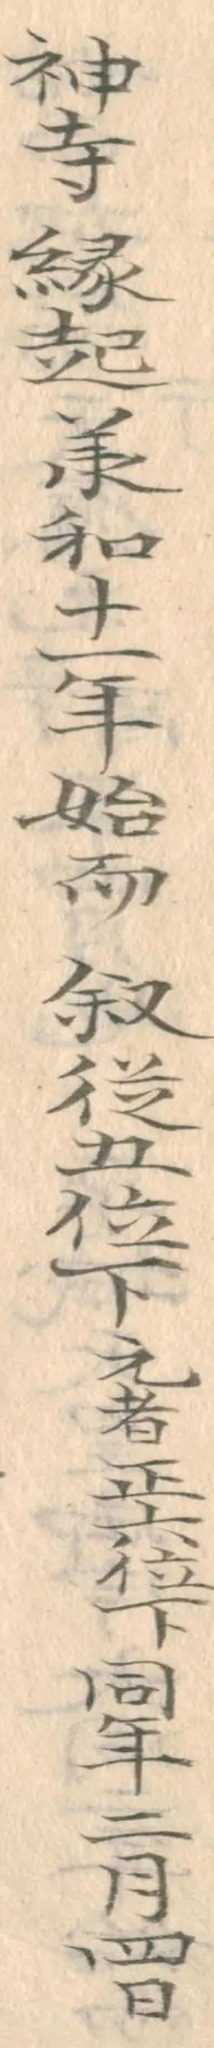神寺縁起承和十一年始而叙従五位下元者正六位下同年二月四日
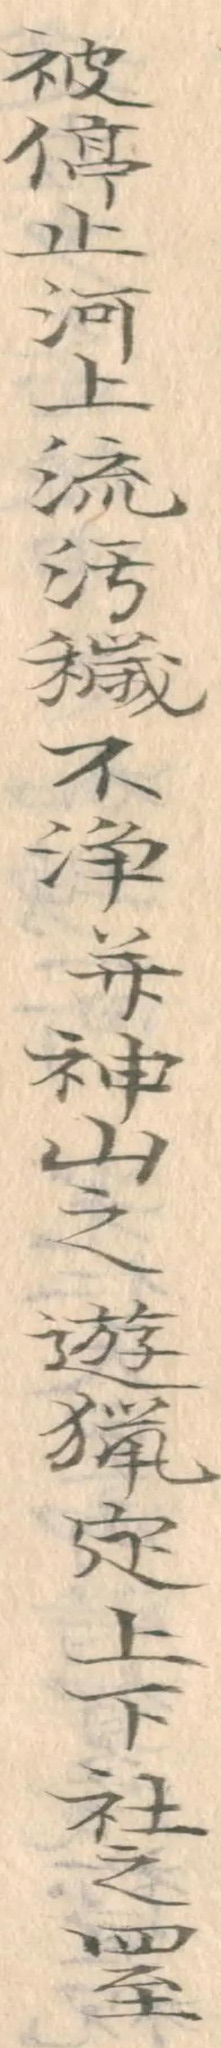被停止河上流汚穢不浄并神山之遊猟定上下社之四至
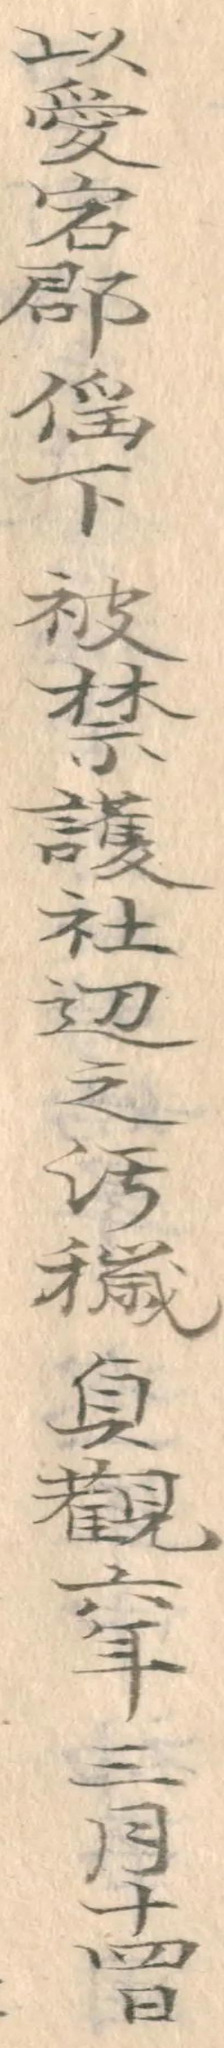以愛宕郡傜下被禁護社辺之汚穢貞観六年三月十四日
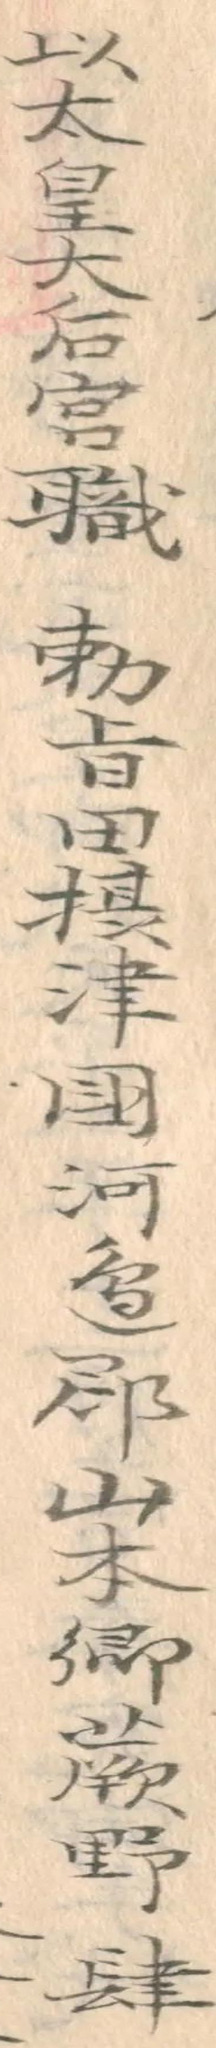以太皇大后宮職勅旨田摂津国河辺郡山本郷蕨野肆
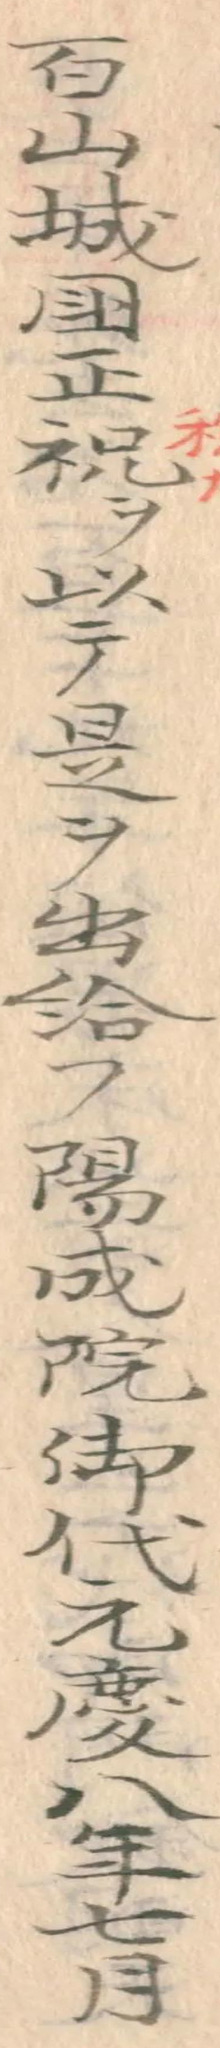百山城国正祝ヲ以テ是ヲ出給フ陽成院御代元慶八年七月
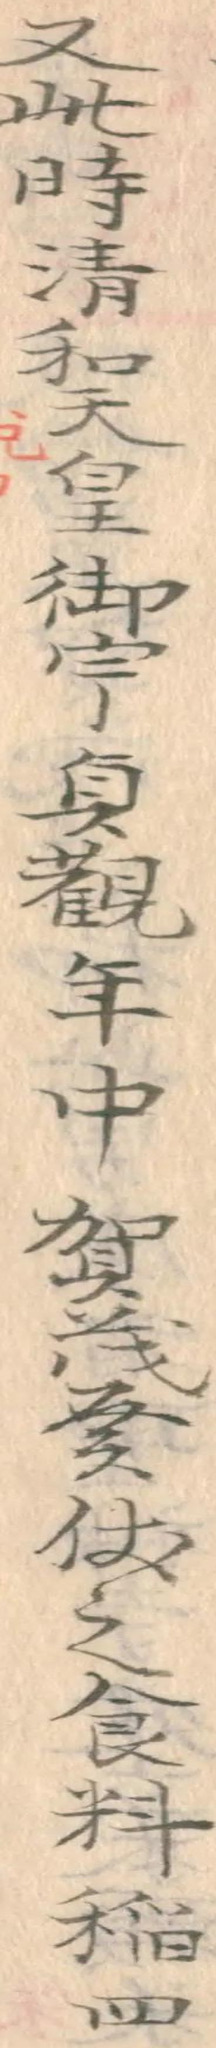又此時清和天皇御宇貞観年中賀茂癸伏之食料稲四
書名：賀茂社記録. 第24冊
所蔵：国立国会図書館 National Diet Library, JAPAN
